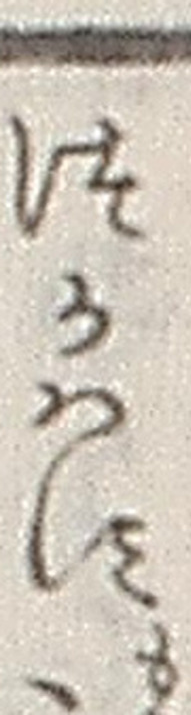つかはす
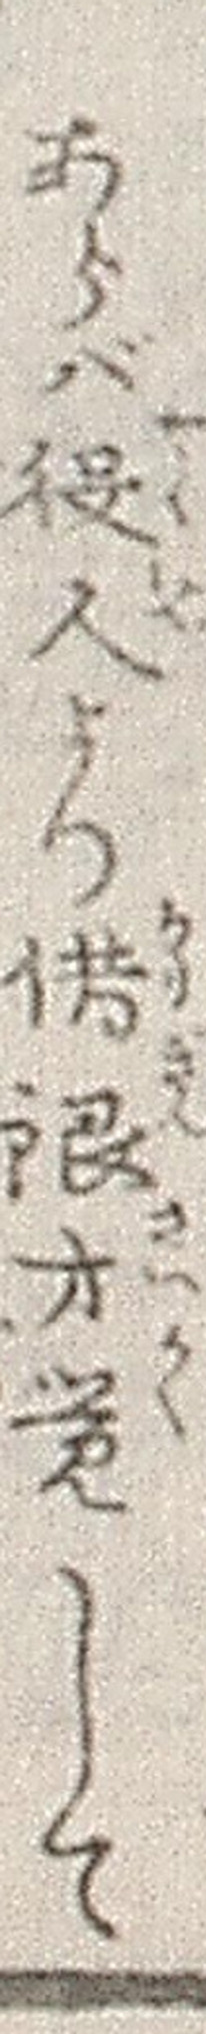あらば役人より借銀才覚して
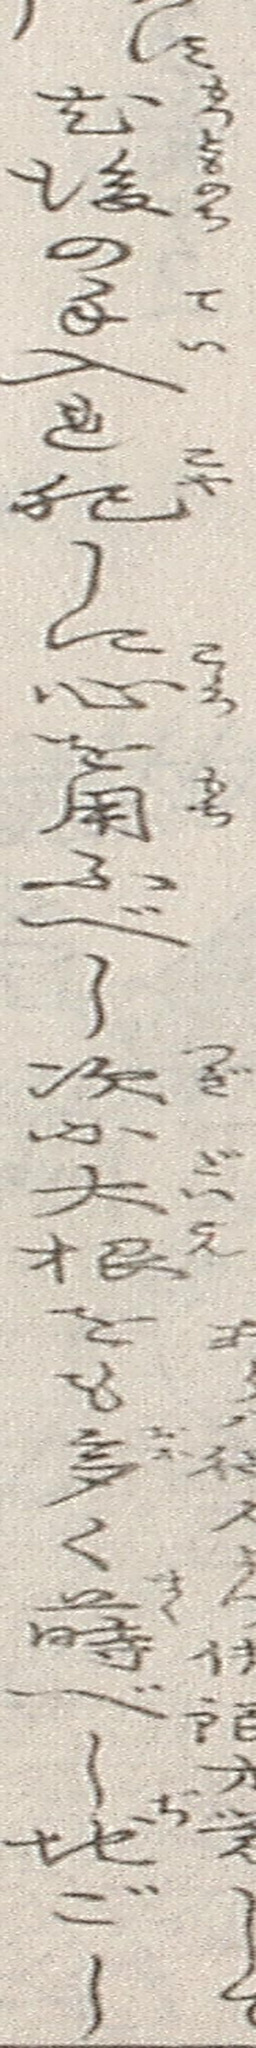尤後の手入れ肥しに心を用ふべし次に大根をも多く蒔べし地ごし
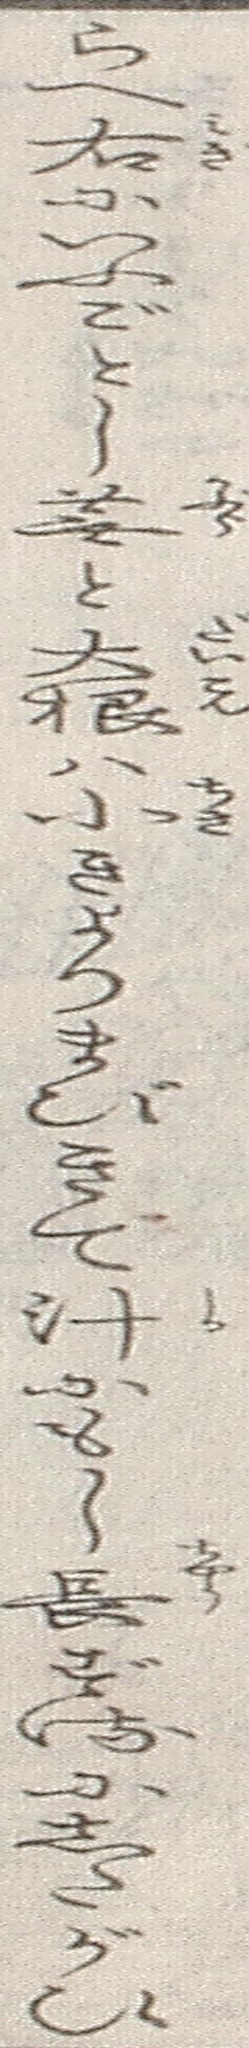らへ右にいふごとし蕪と大根は小きよりまびきて汁にもし長ずるにしたがひ
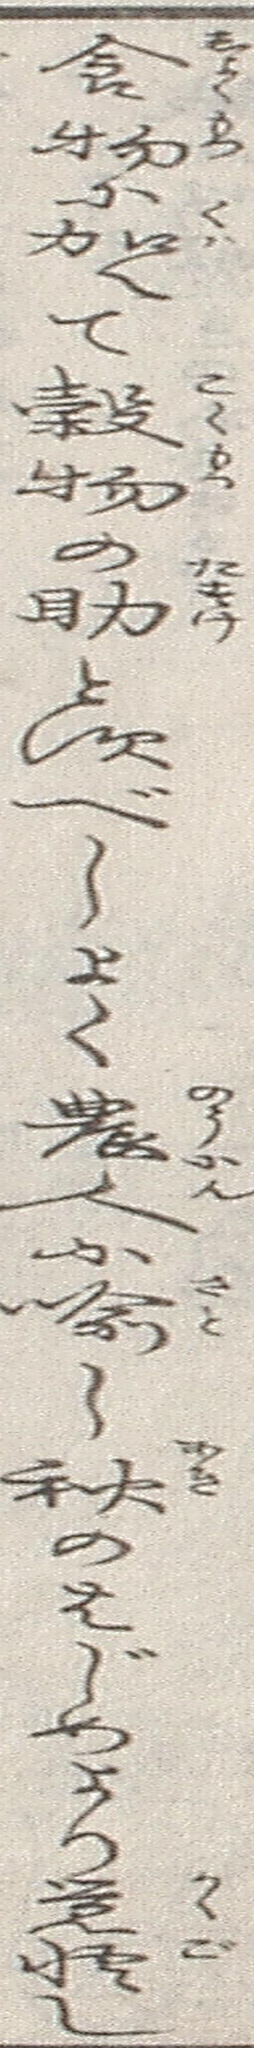食物に加へて穀物の助とすべしよく農人に諭し秋のはじめより覚悟し
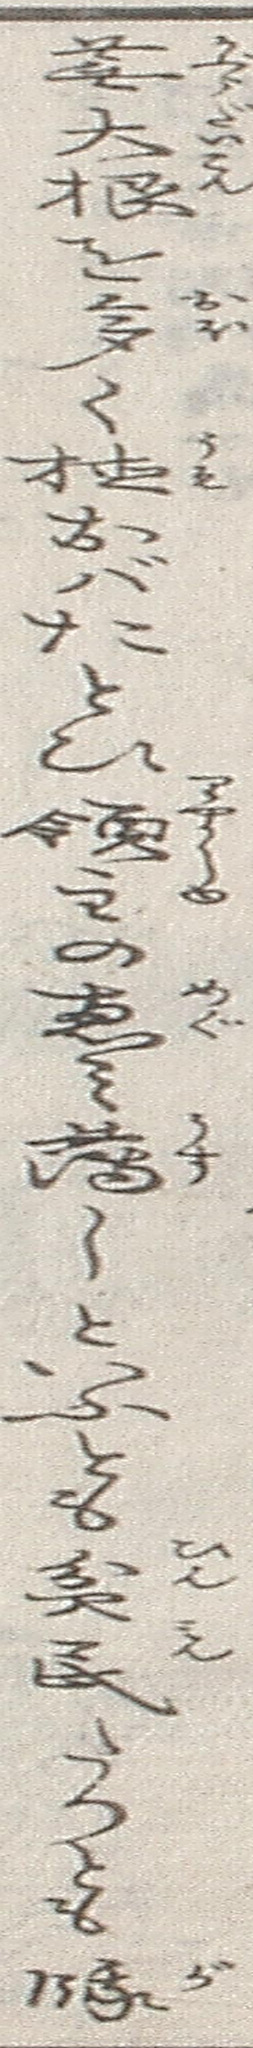蕪大根を多く植なばたとひ領主の恵み薄しといふとも貧民たりとも餓
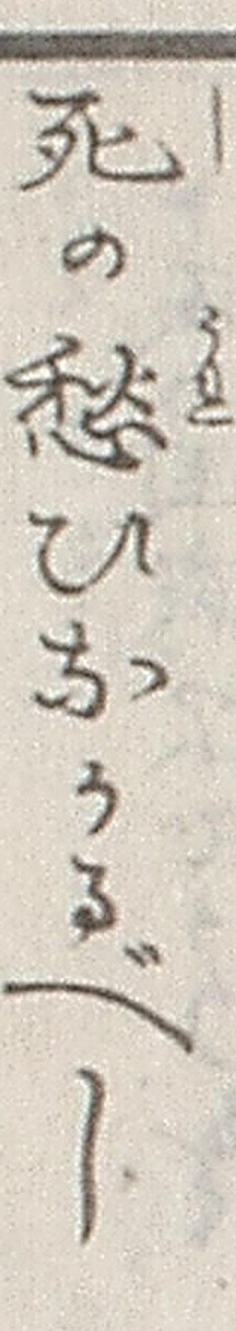死の愁ひなかるべし

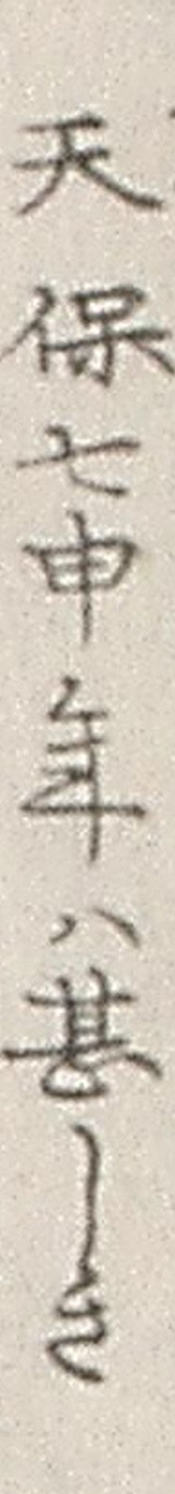天保七申年は甚しき
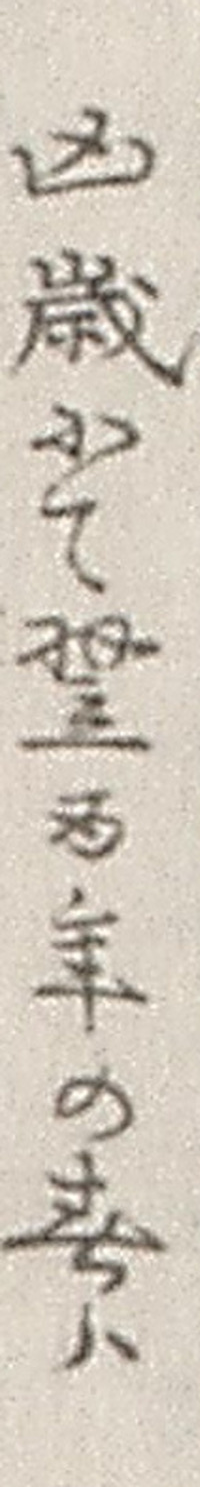凶歳にて翌酉年の春は
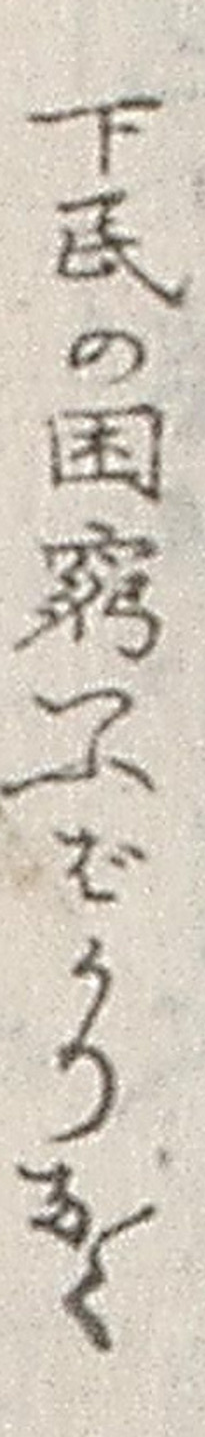下民の困窮いふばかりなく
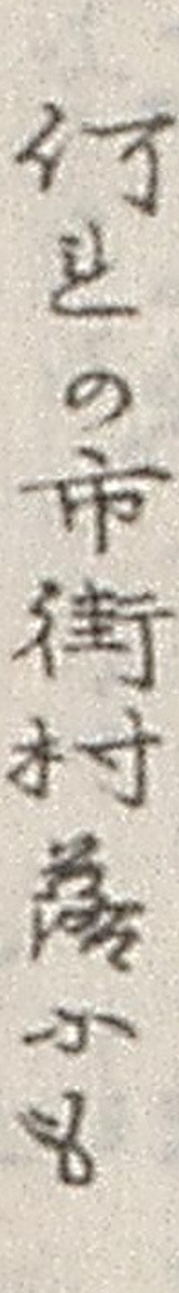何れの市街村落にも
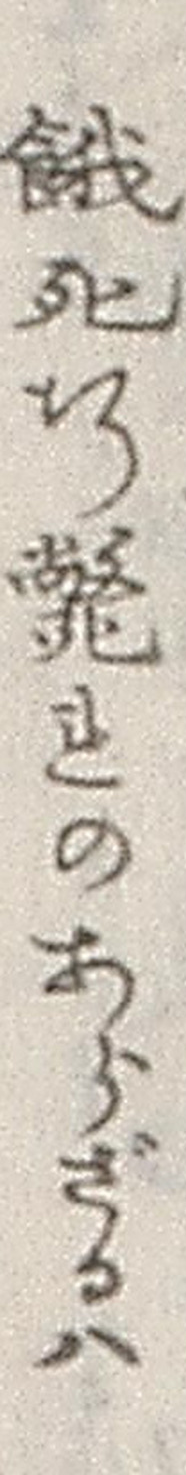餓死行斃れのあらざるは
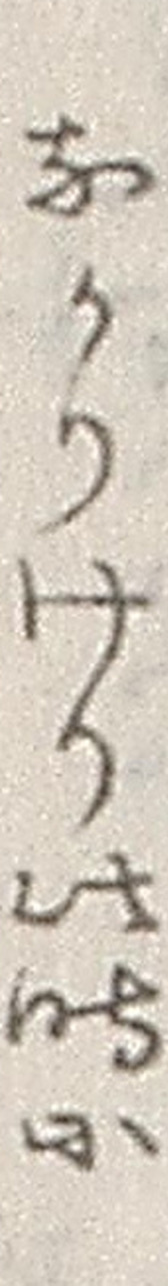なかりけり此時に
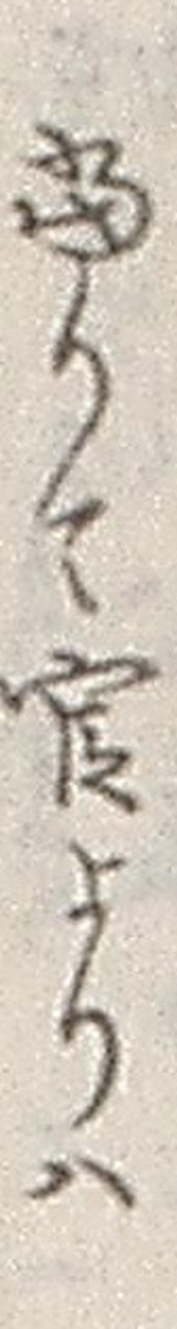当りて官よりは
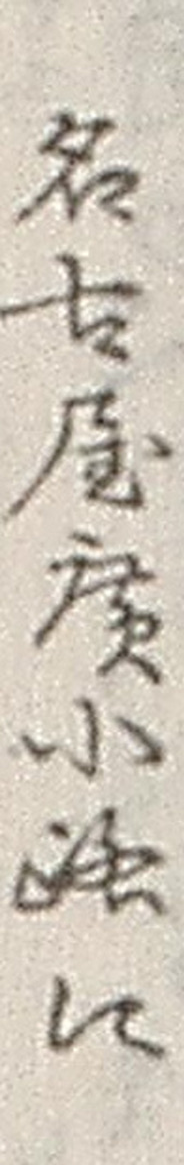名古屋広小路に
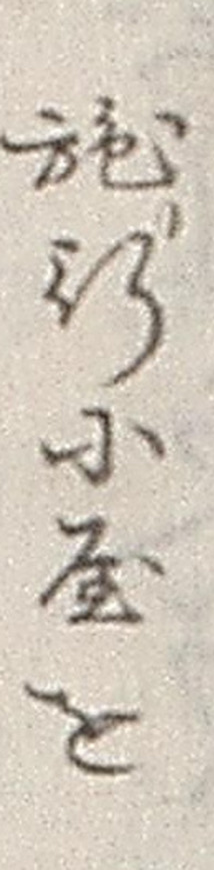施行小屋を
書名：凶荒図録　完
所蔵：東京大学地震研究所図書室 Earthquake Research Institute Library, The University of Tokyo, JAPAN
